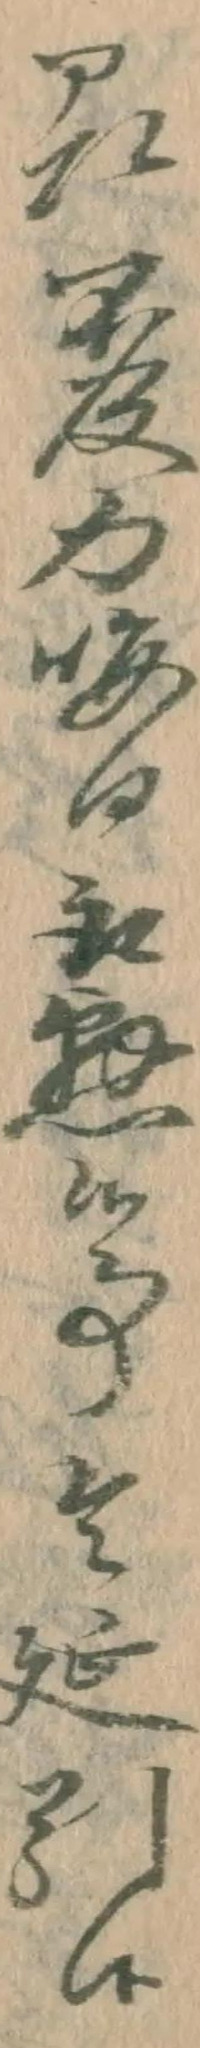州不及力晦日取懸候事令延引候
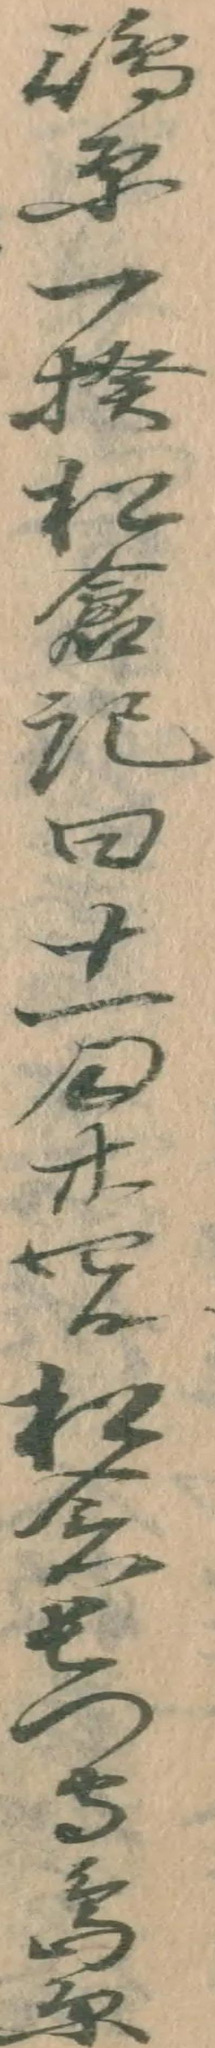島原一揆松倉記曰十一月廿四日松倉長門守島原
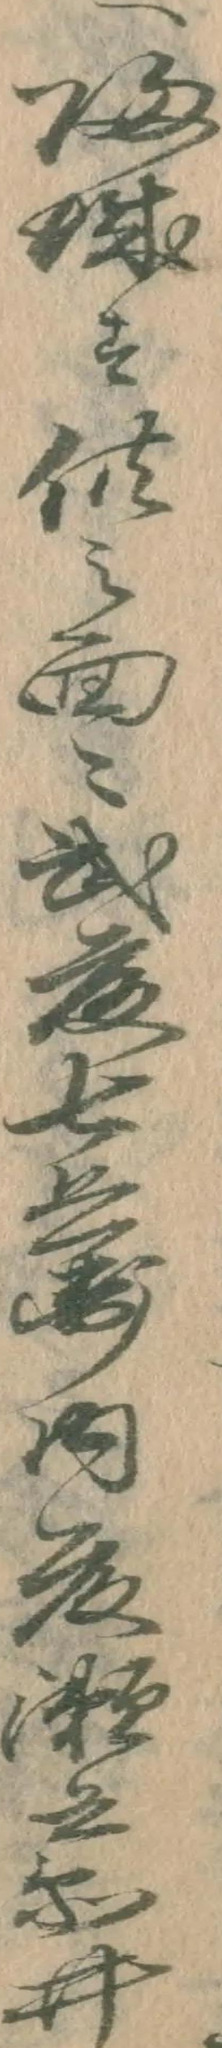へ帰城す供之面々武藤七兵衛内藤瀬兵衛井
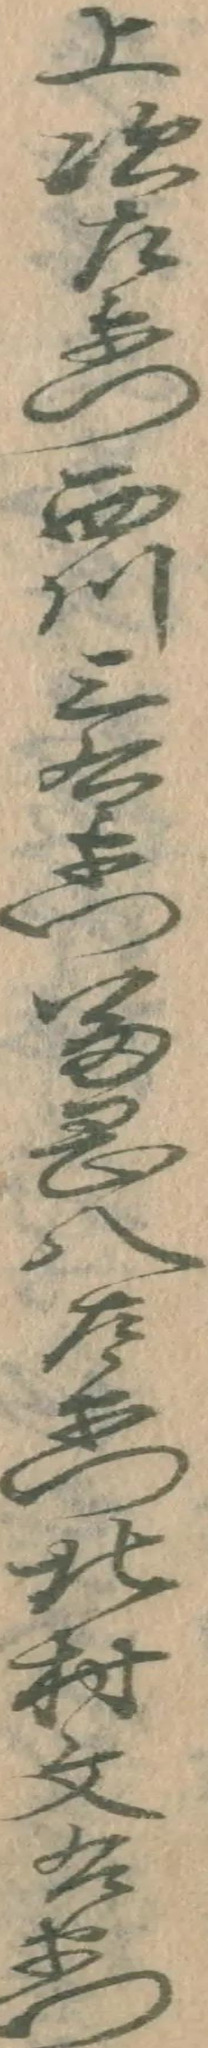上次左衛門西川三右衛門富岡八左衛門北村文右衛門
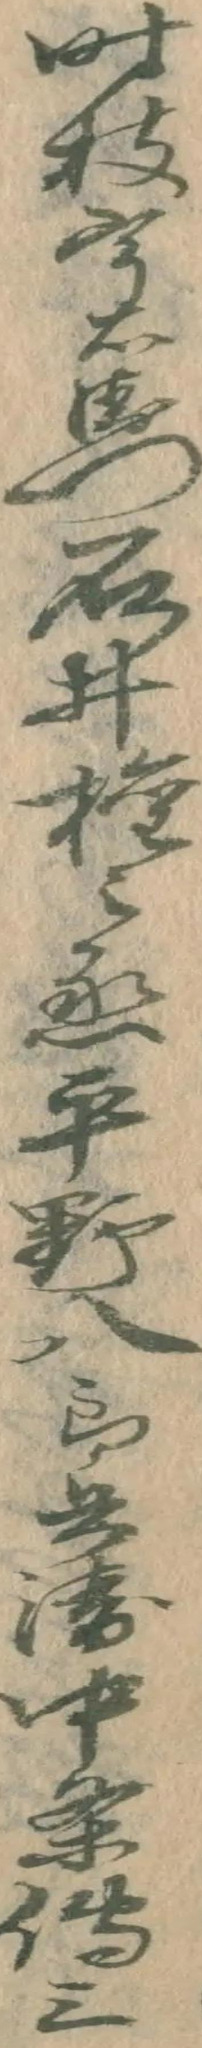時枝宇右衛門石井権之丞平野八郎兵衛中条伝三
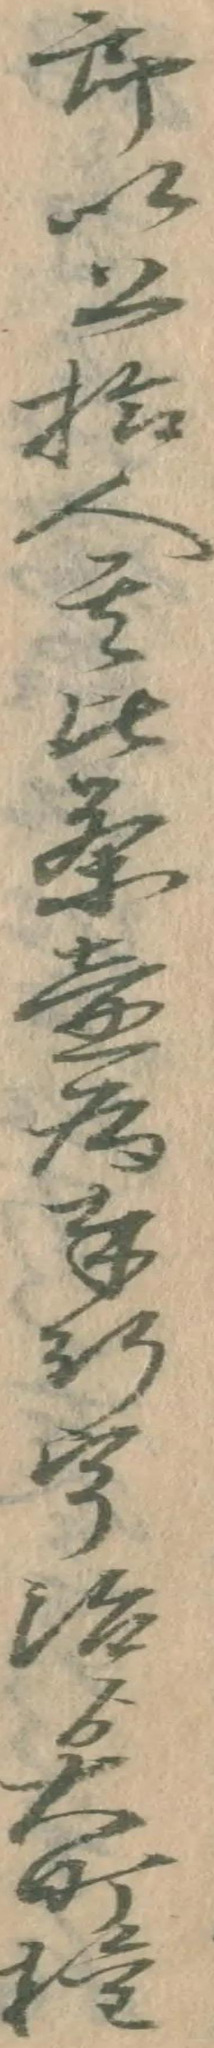郎以上拾人其比茶壺為奉行宇治ゟ大町種
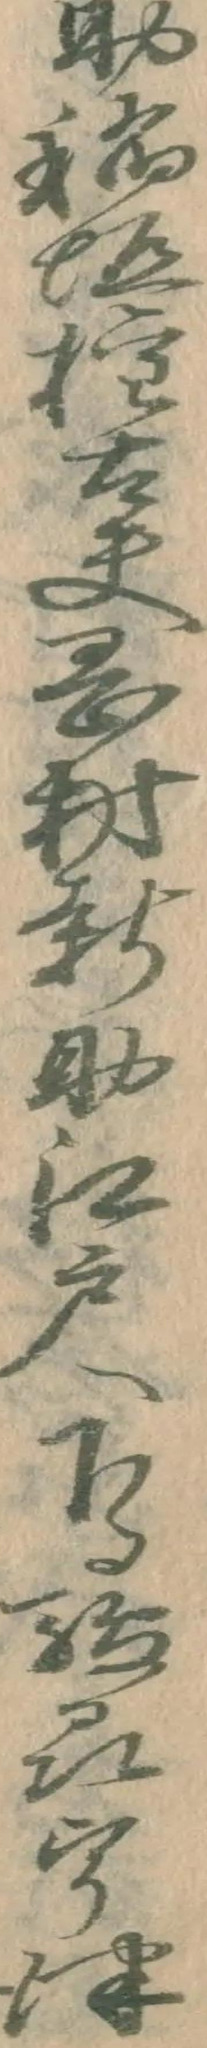助稲垣権太夫岡村新助江戸へ下る駿州宇津
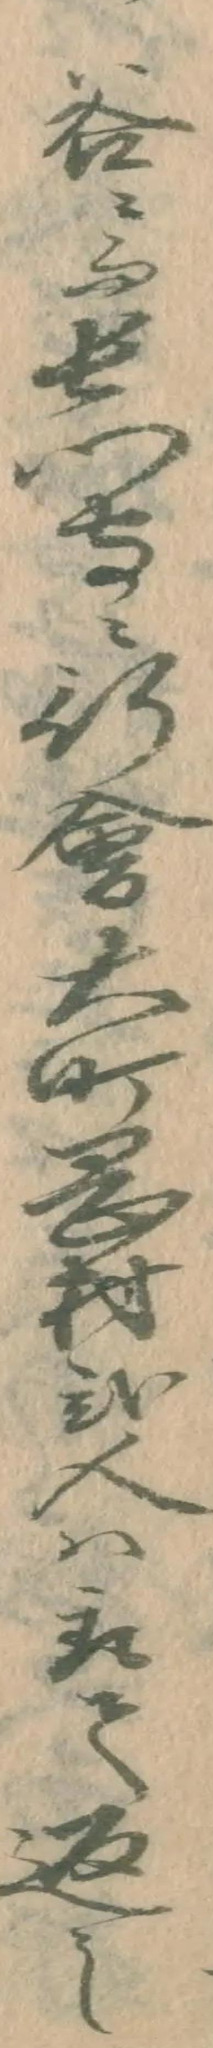ノ谷に而長門守に行会大町岡村弐人は取て返し

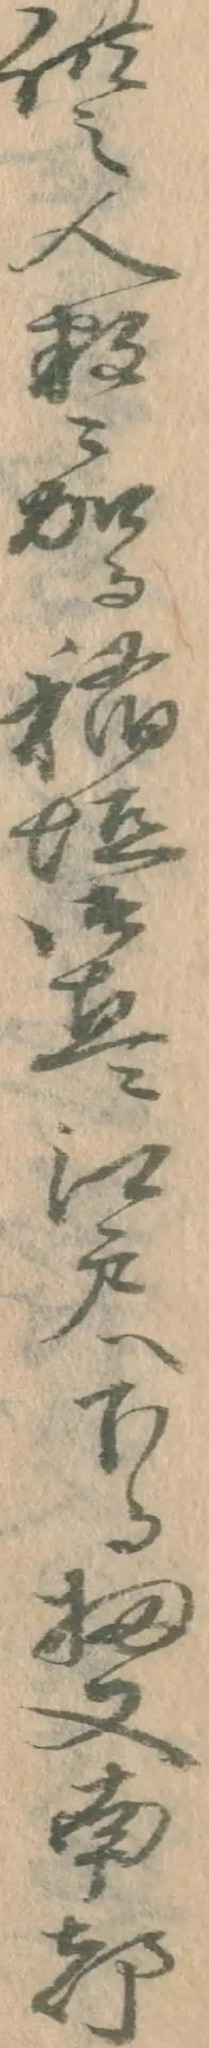供之人数に加る稲垣御立に江戸へ下る扨又南都
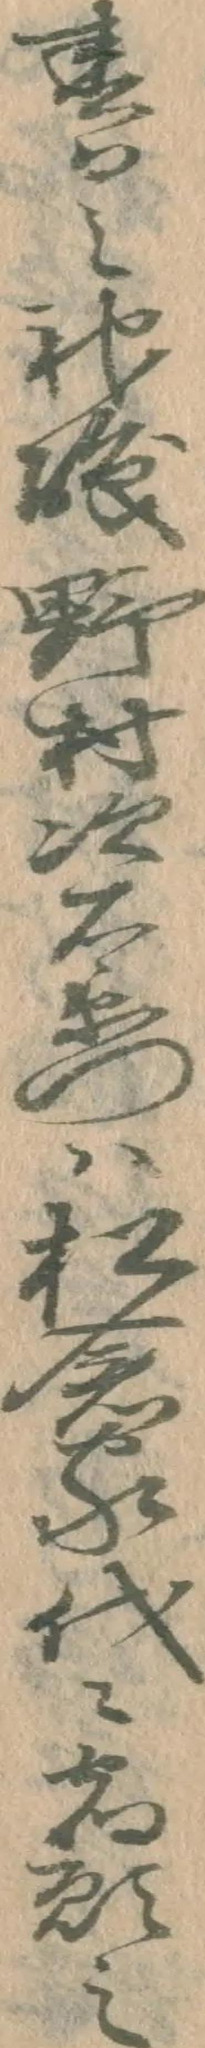春日之神職野村次右衛門は松倉家代々宿願之
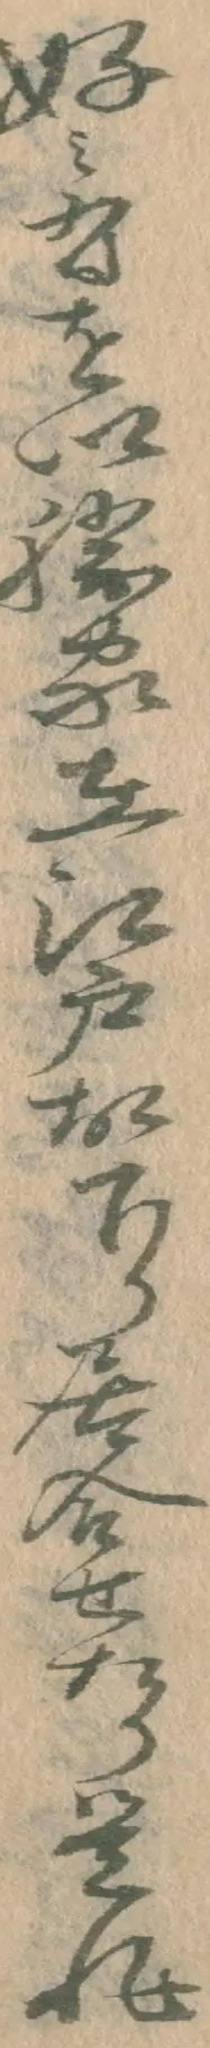好み有を以勝家在江戸故下り居合せたり是非
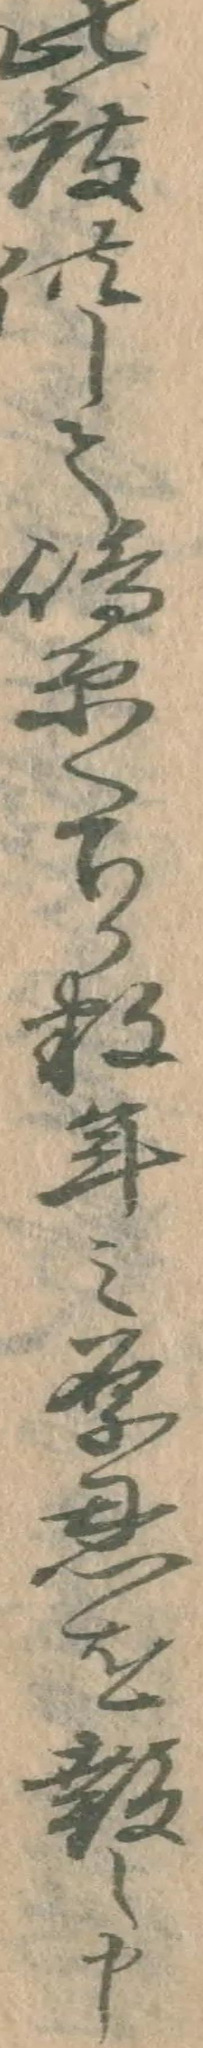此度供して島原へ下り数年之厚恩を報し申
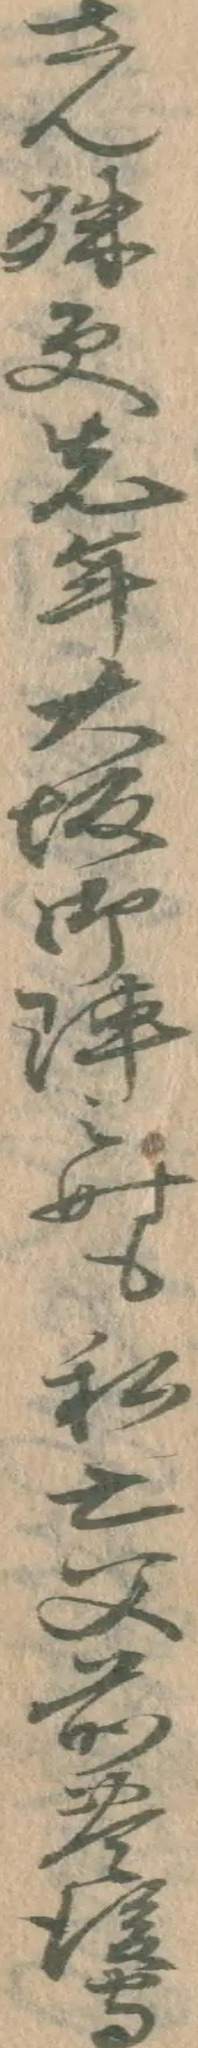さん殊更先年大坂御陣之時も私亡父前豊後守
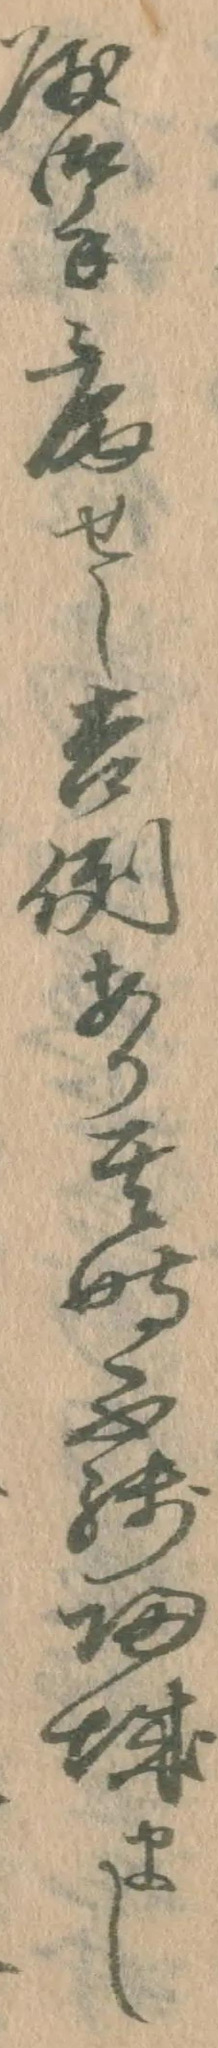殿御手に属せし吉例あり其時不残帰城まし
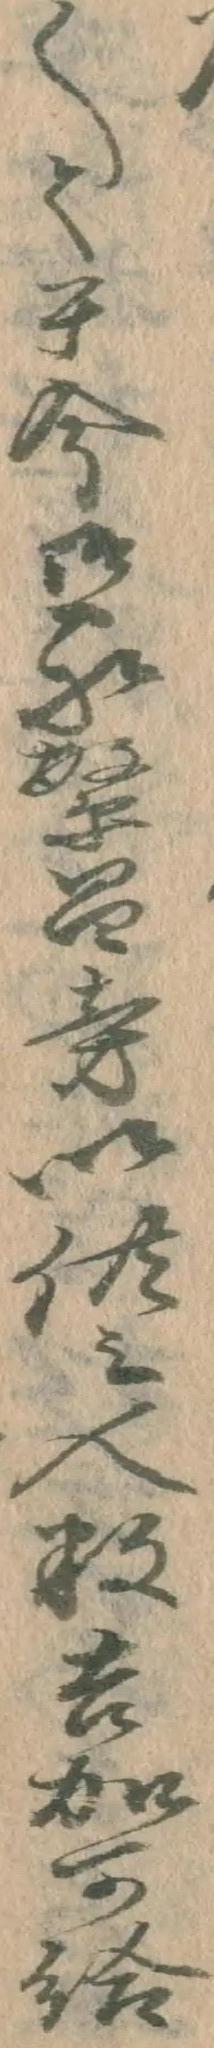〳〵て尓今御家繁昌旁以供之人数吉加可給
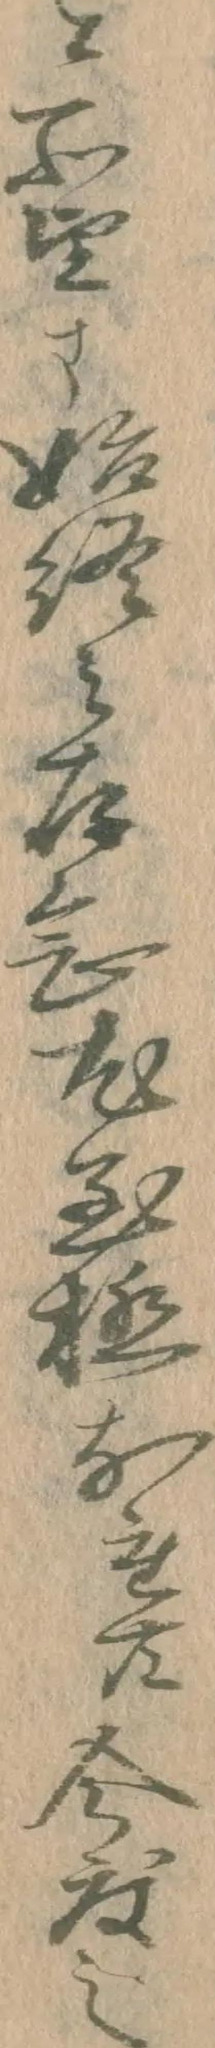と所望す始終之存念尤至極なれ共今度之
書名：切支丹御退治記 49巻. [3]
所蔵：国立国会図書館 National Diet Library, JAPAN
